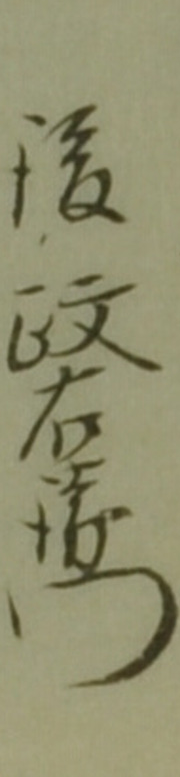後政右衛門
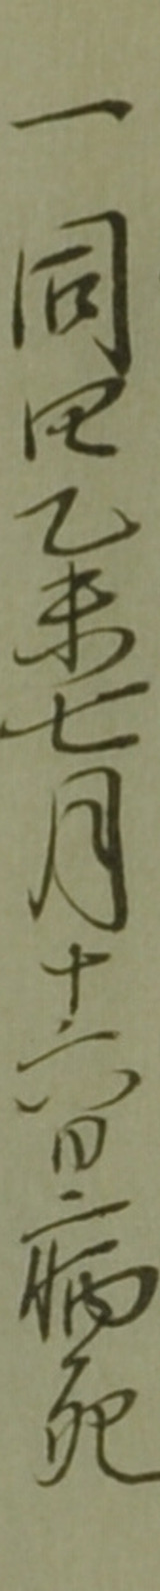一同四乙未七月十六日病死
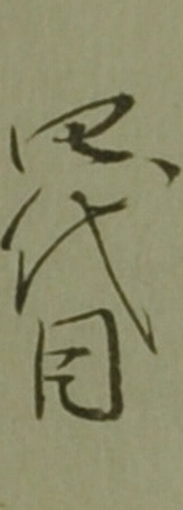四代目
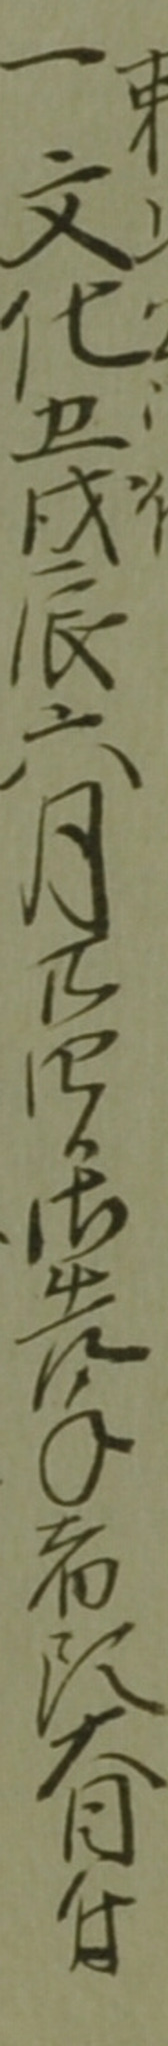一文化五戊辰六月廿四日御先手者頭大目付
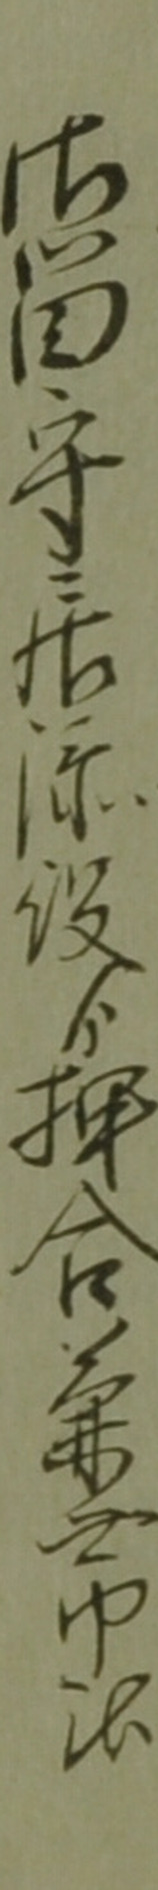御留守居添役ゟ押合兼帯被
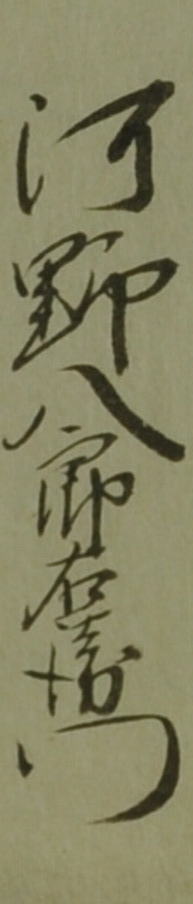河野八郎右衛門
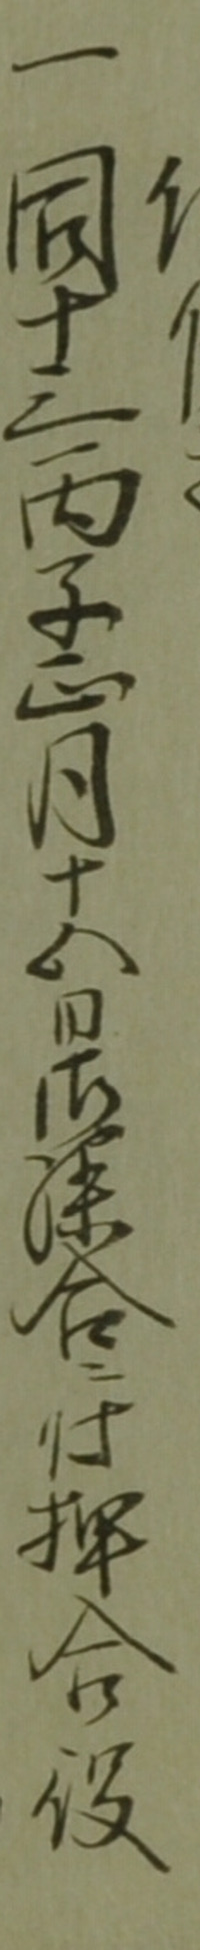一同十三丙子正月十五日御繰合ニ付押合役
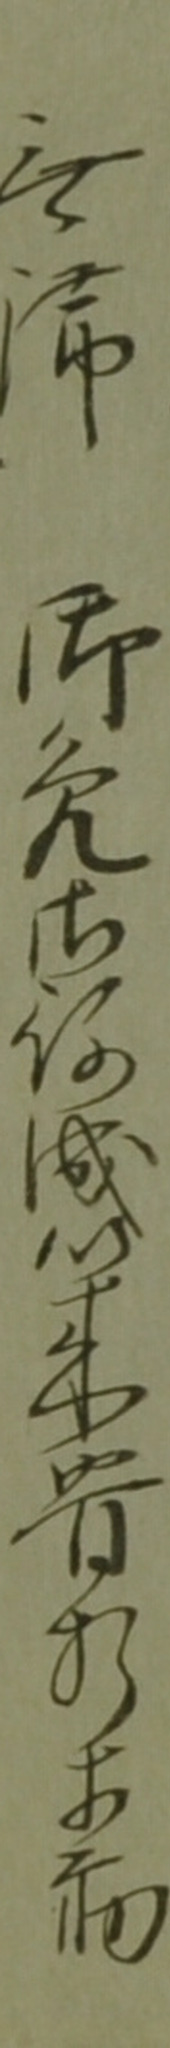無滞御免御役成以来骨折相勤
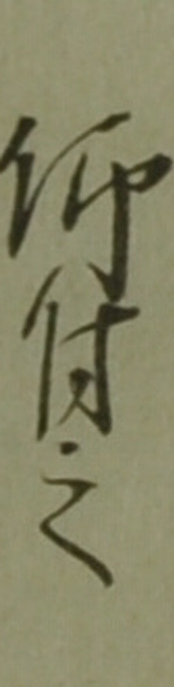仰付之
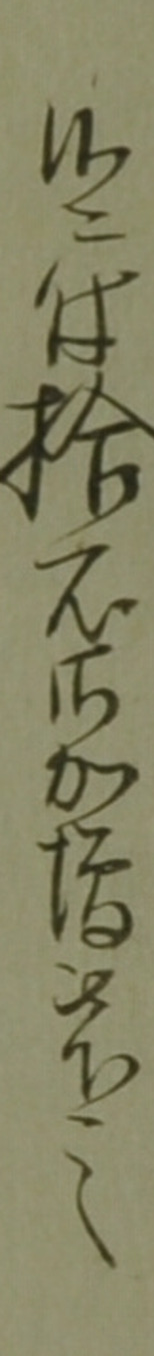候ニ付拾石御加増被下之
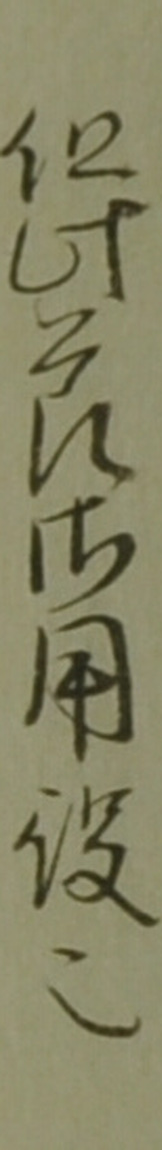但此節御用役也

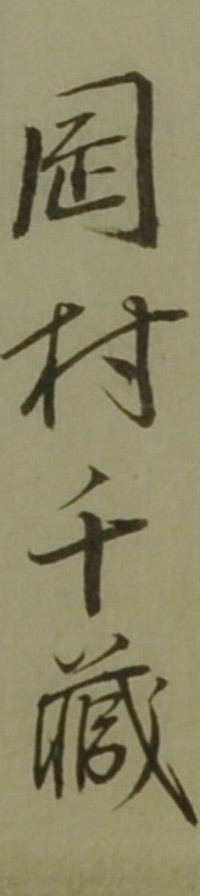岡村千蔵
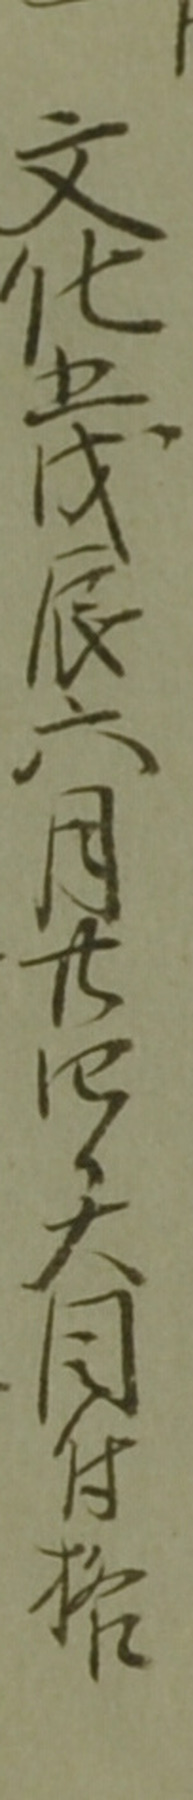一文化五戊辰六月廿四日大目付格
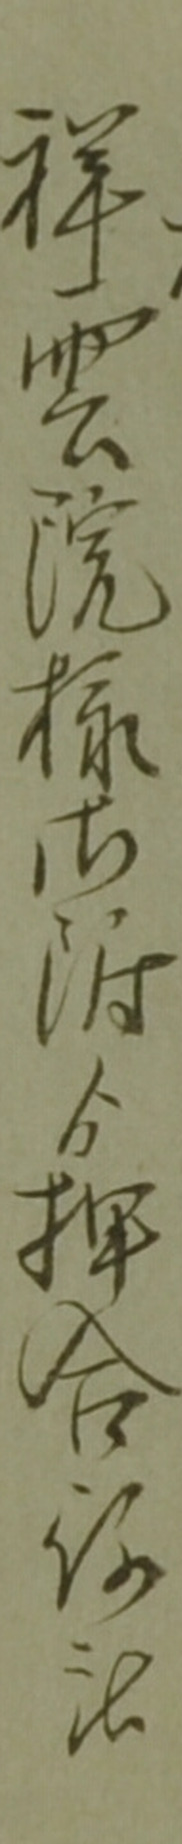祥雲院様御附ゟ押合役被
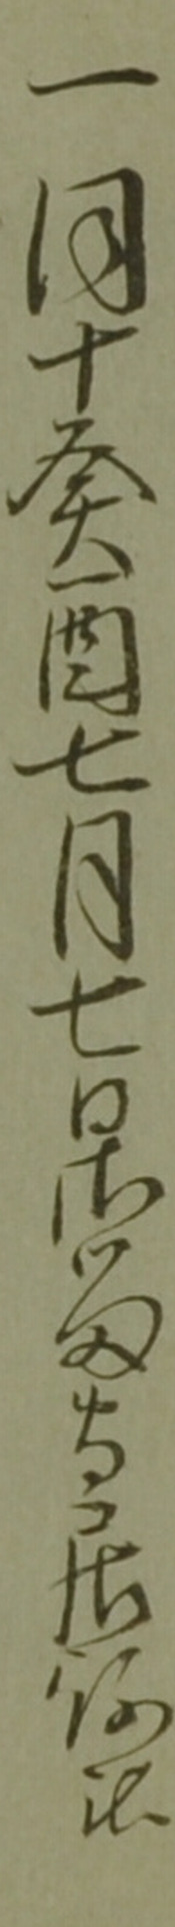一同十癸酉七月七日御留守居役被
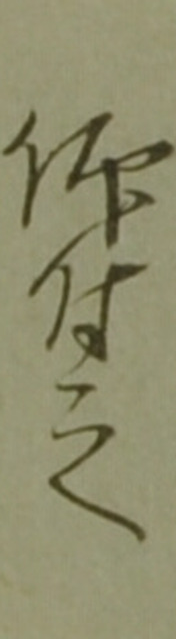仰付之
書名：諸御役代々録（七）
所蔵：伊那市立高遠町図書館・合同会社AMANE
